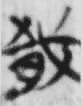歲（歲）
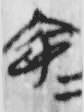身竆
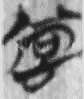尚
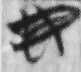母
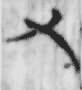又（有）
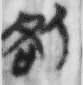咎
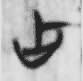占
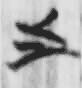之
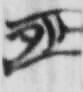亙（恆）
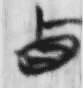貞
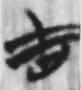吉
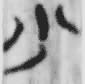少
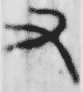又（有）
